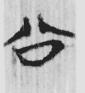公
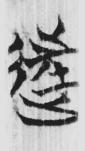{辶之𡈼}
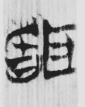䎽
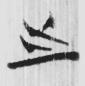之
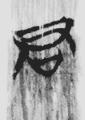君
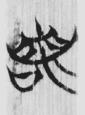若
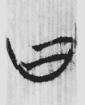曰
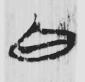白
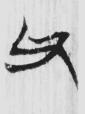父
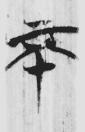不
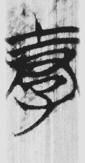{𫯁子}
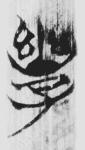{幽子}
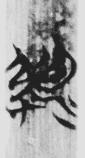溺
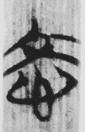忞
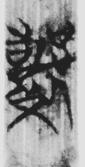{喪死}
